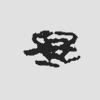是
